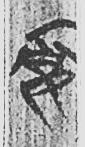妻
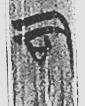司
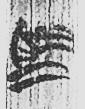馬
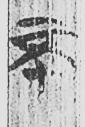不
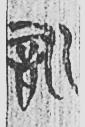訓
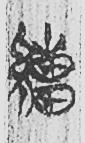{糸東田}
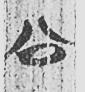公
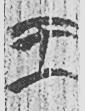王
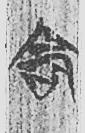命
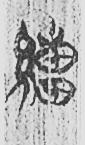{糸東田}
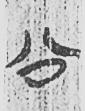公
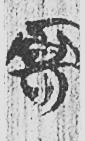{口甹}
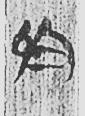於
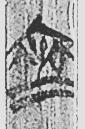齊
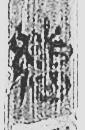{糸東田}
